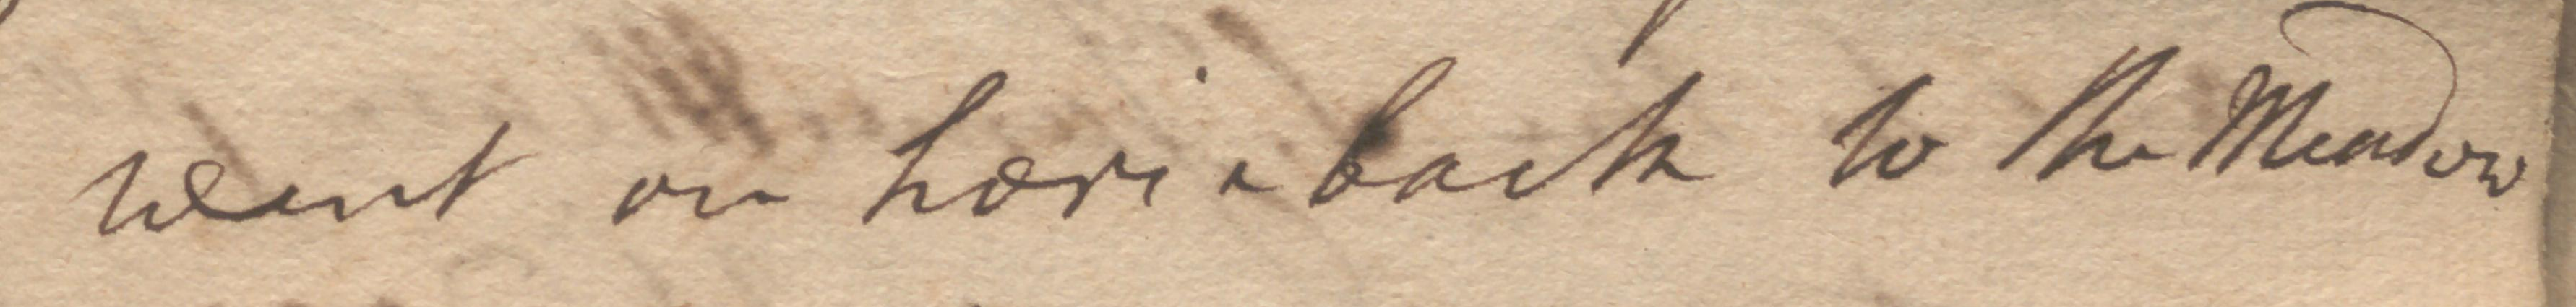went on horse back to the Meadon
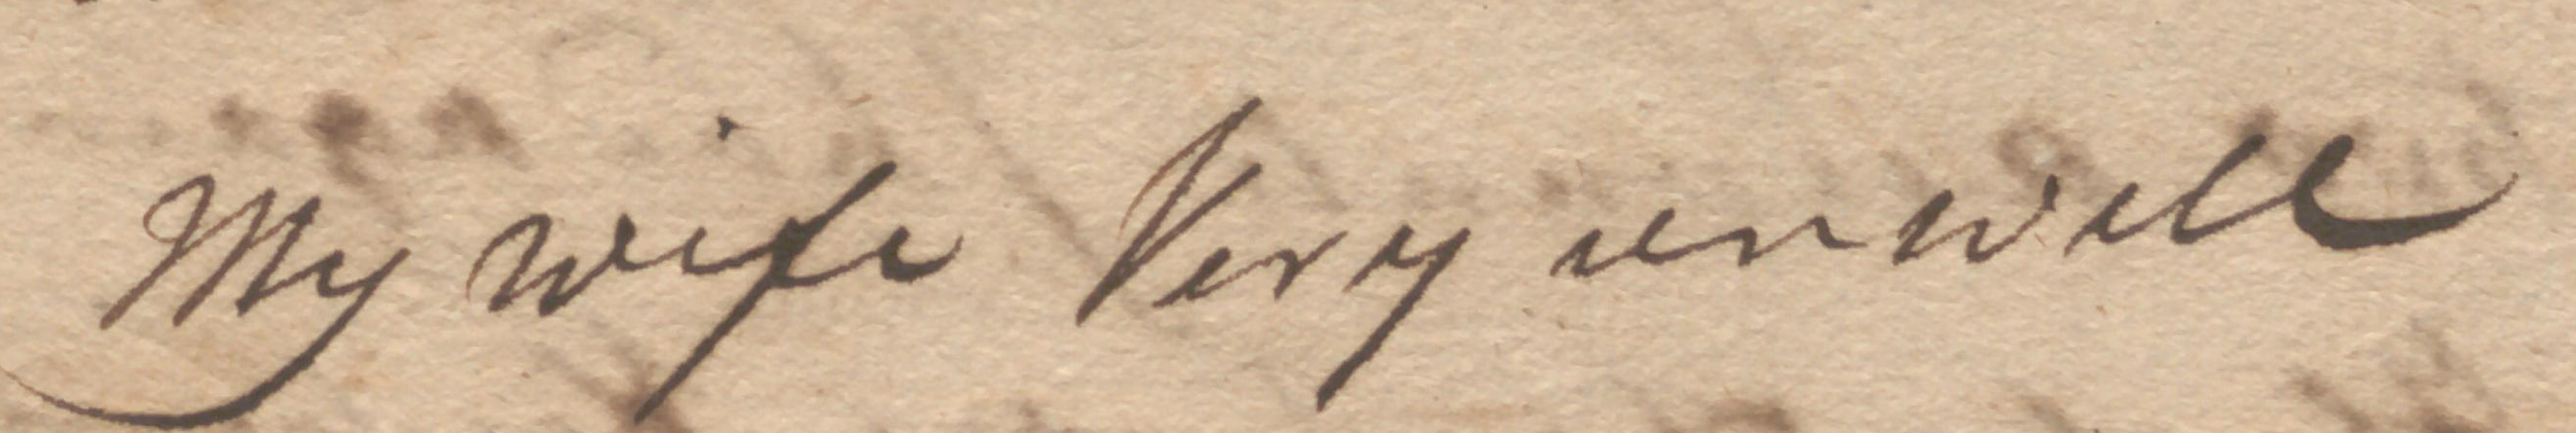My wife Very unwell
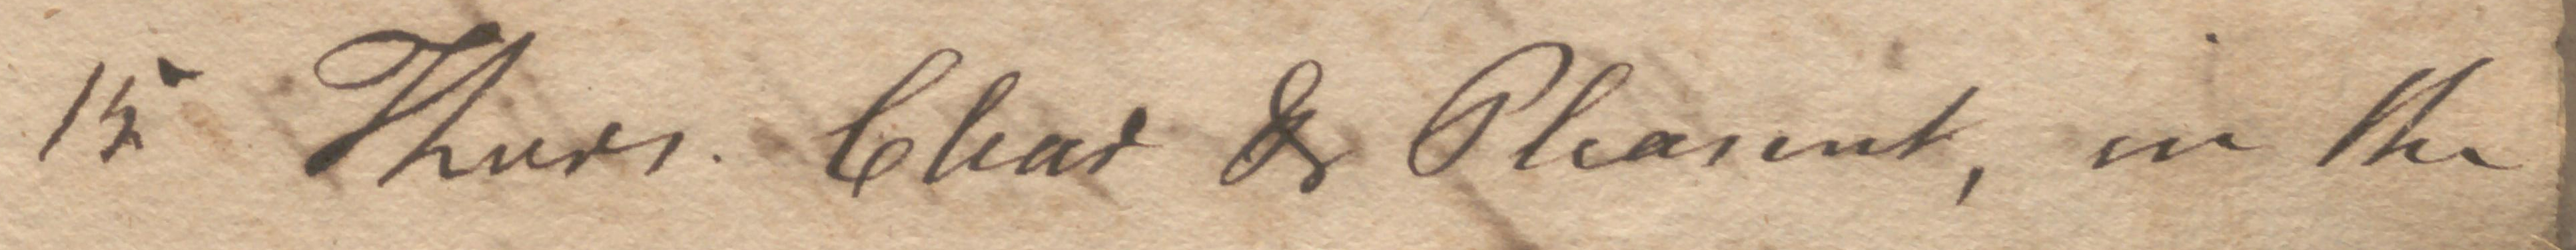15 Thurs. Clear & Pleasent, in the
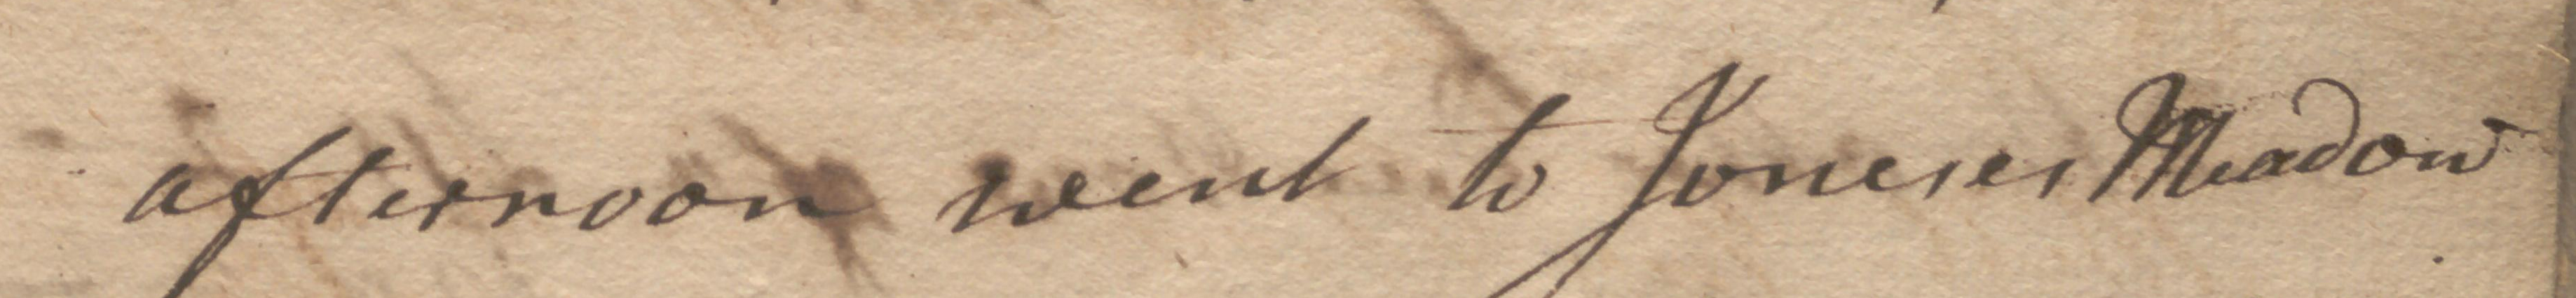afternoon went to Joneses Meadow
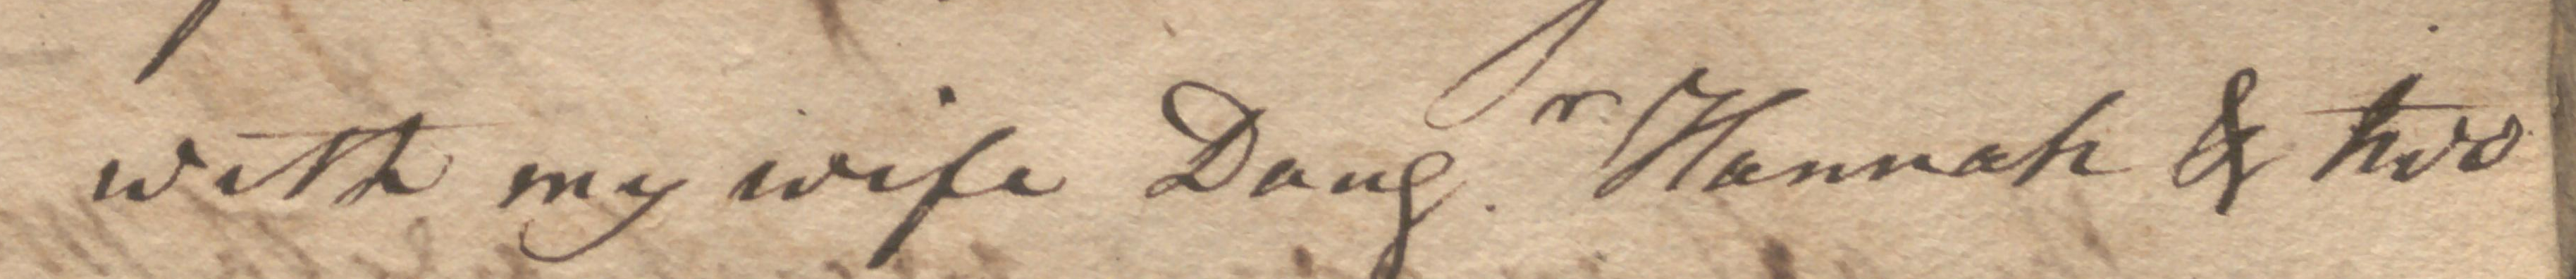with my wife Daug^r. Hannah & two
